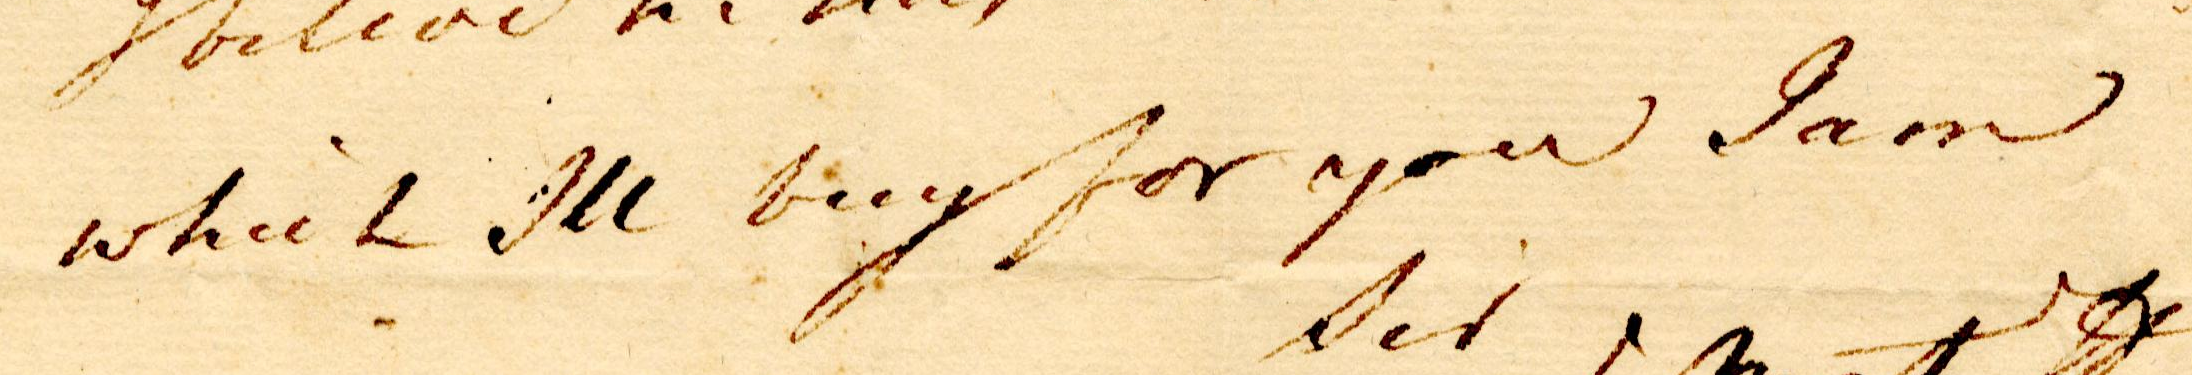which Ill buy for you I am
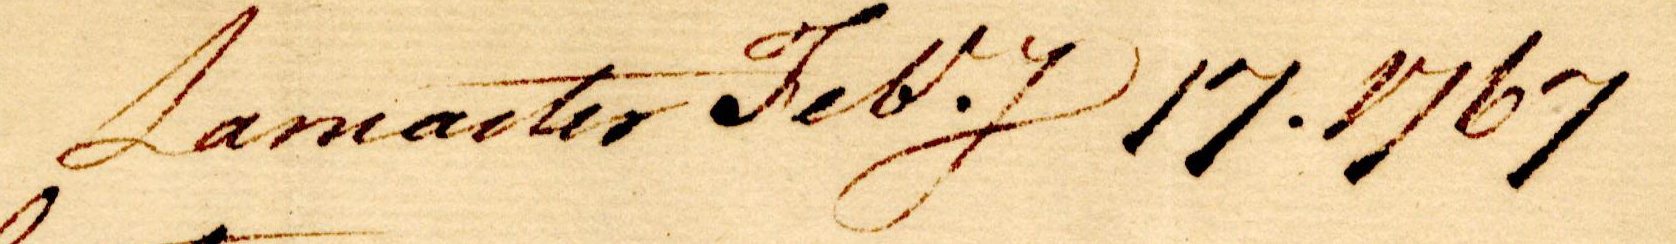Lancaster Feb^y. 17. 1767
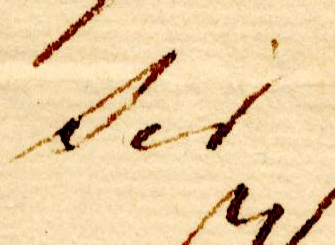Sir
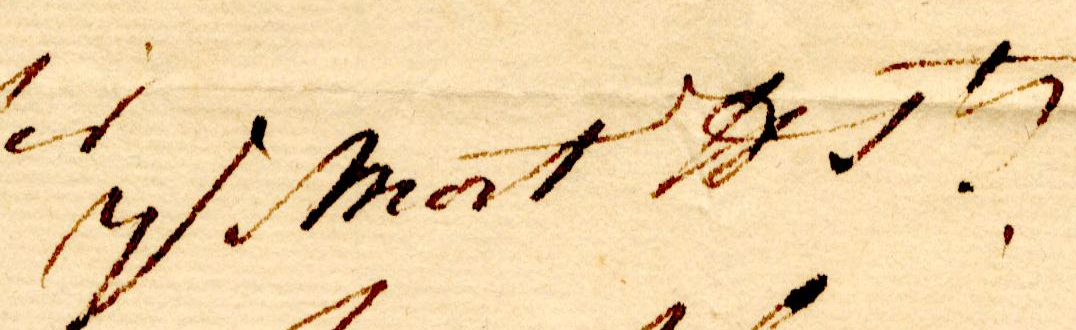Y^r Most H s^t.
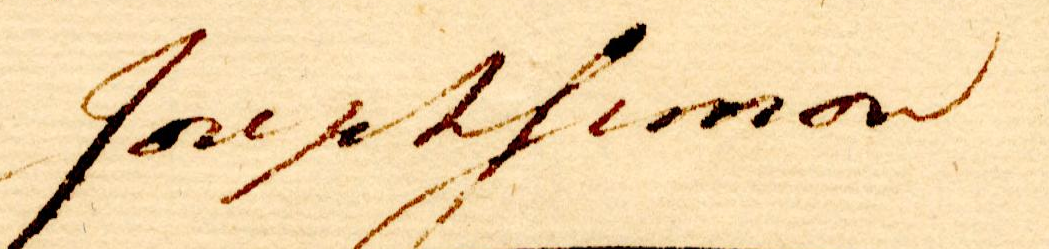Joseph Simon
